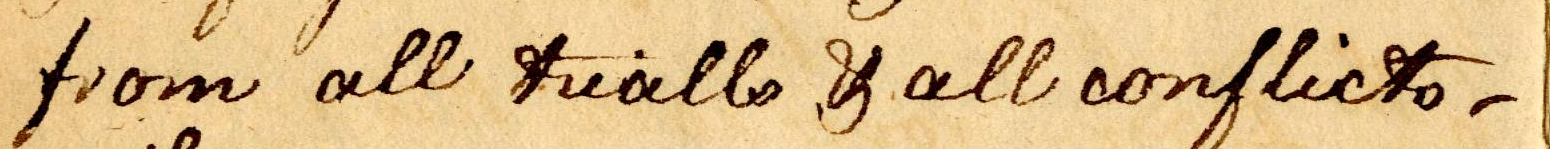from all trialls & all conflicts-
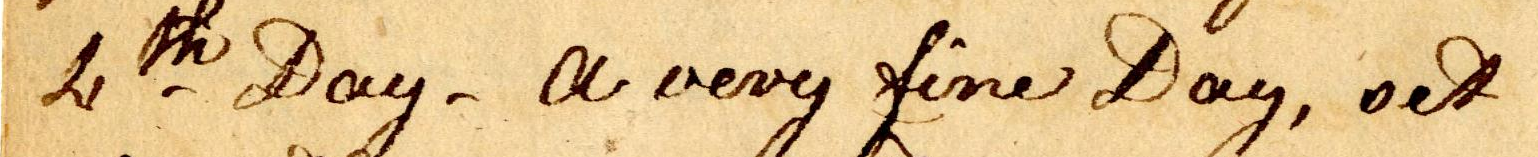4^th Day- A very fine Day, set
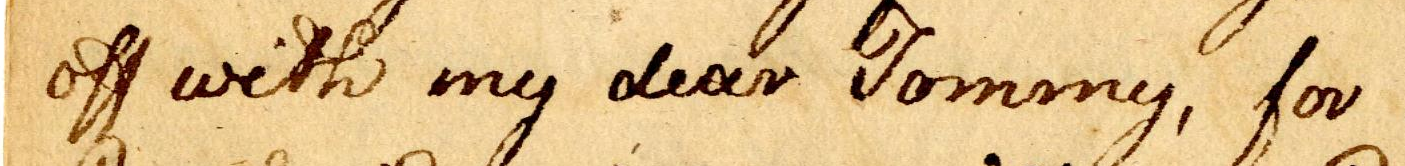off with my dear Tommy, for
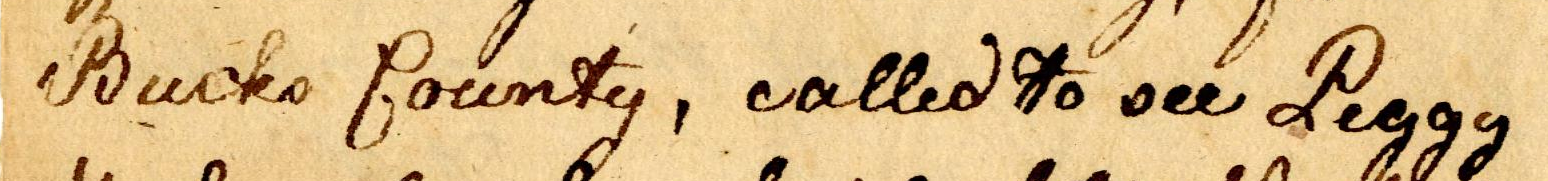Bucks County, called to see Peggy
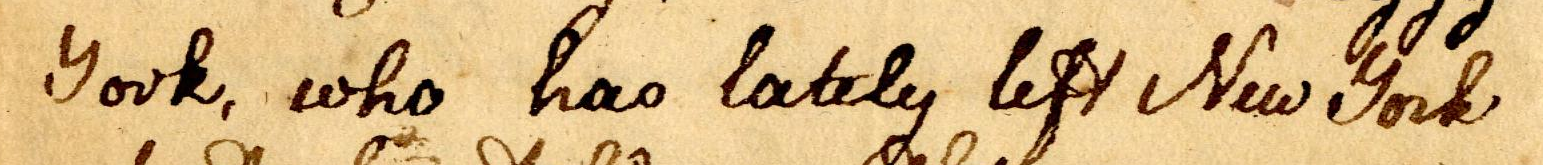York, who has lately left New York
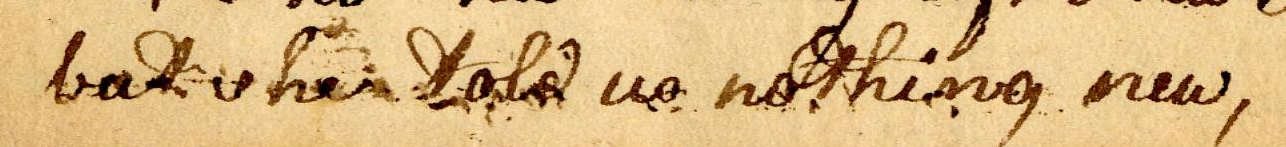but she told us nothing new,
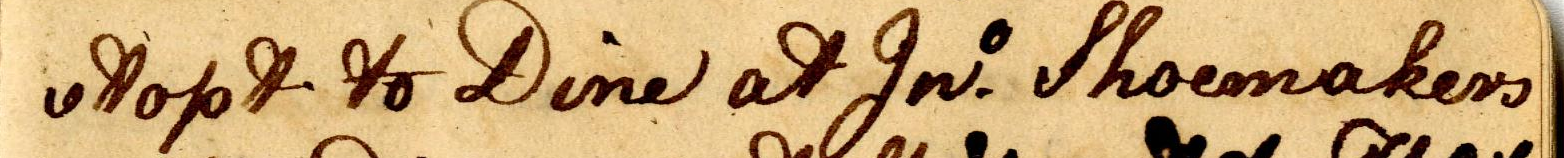stopt to Dine at Jn^o. Shoemakers
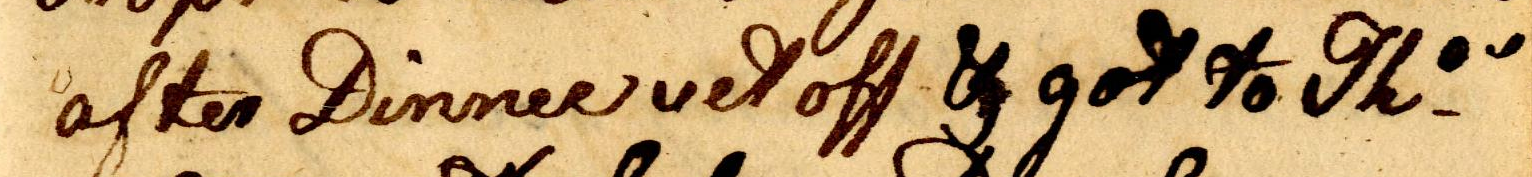after Dinner set off & got to Th^os-
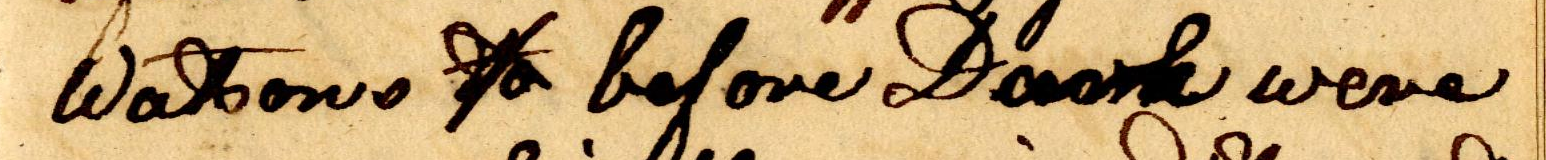Watsons to before Dusk were
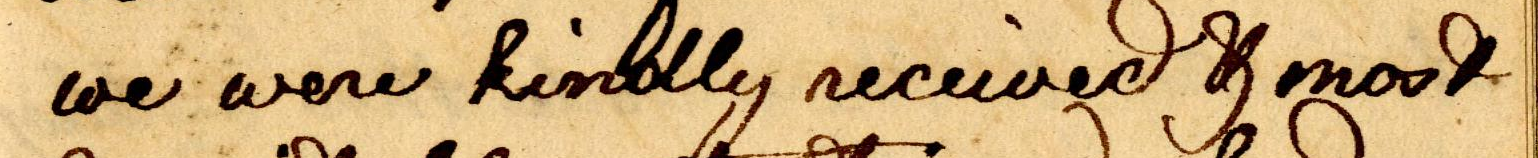we were kindly received & most
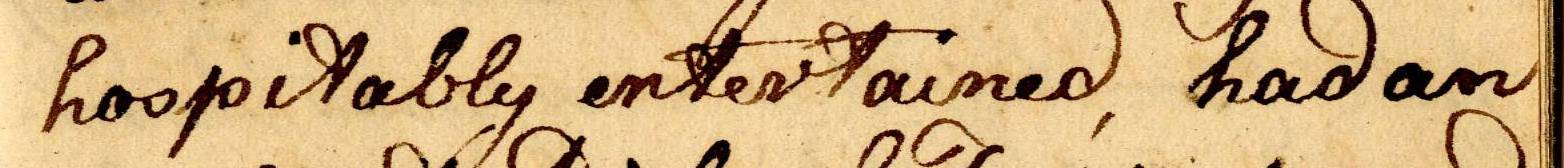hospitably entertained, had an
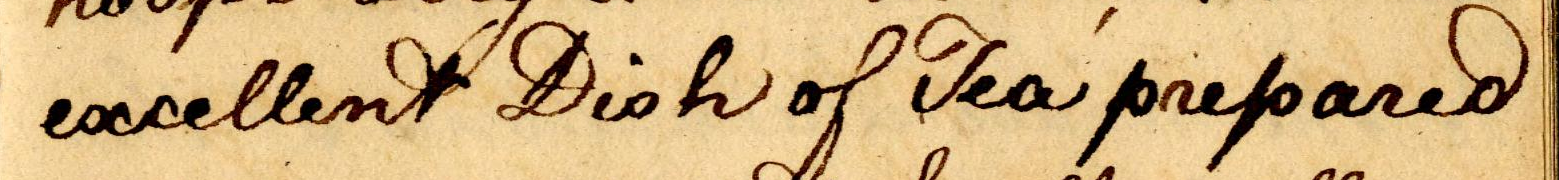excellent Dish of Tea prepared
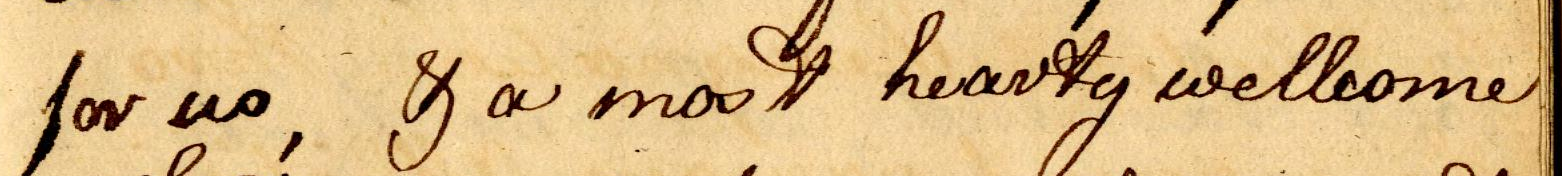for us, & a most hearty wellcome
